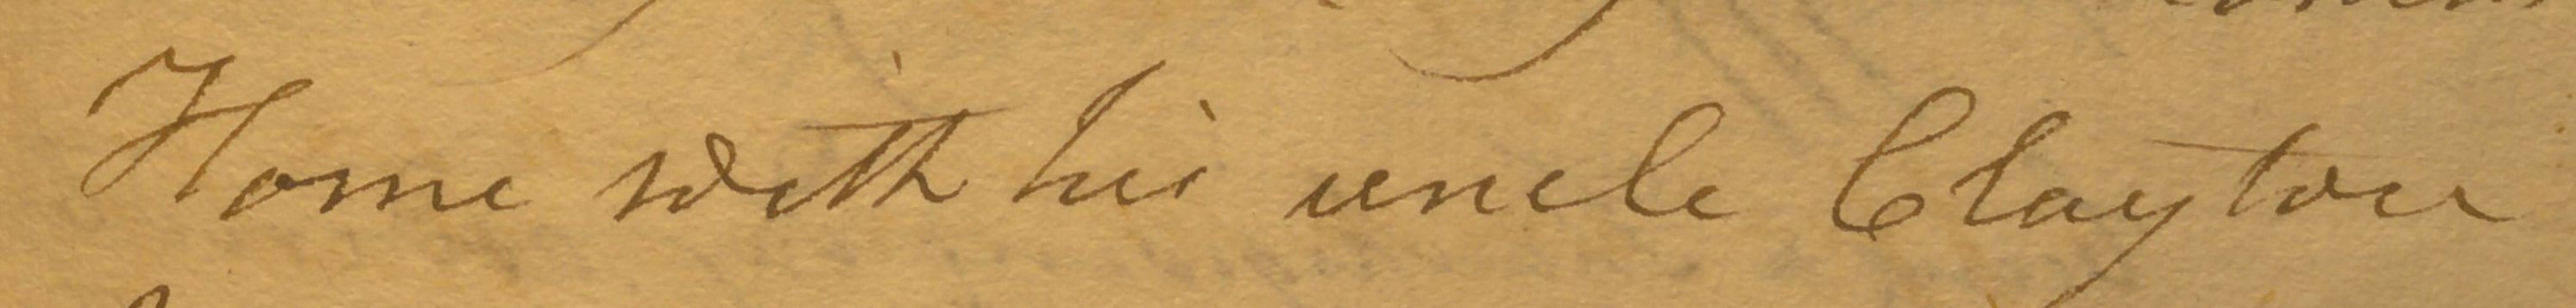Home with his uncle Clayton
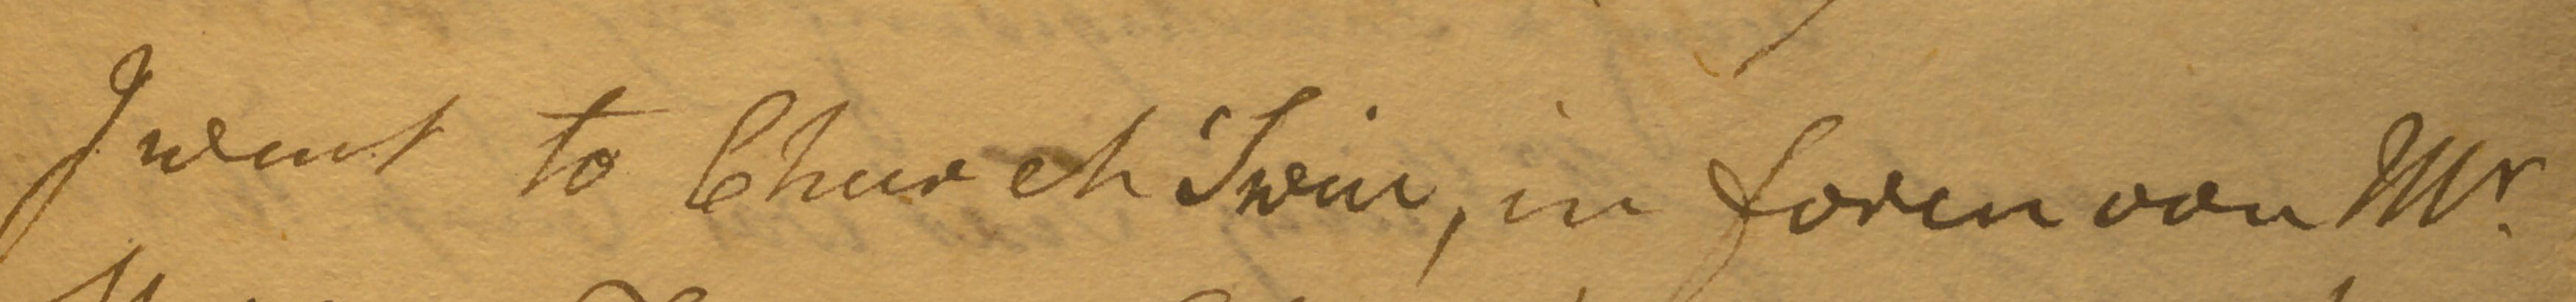I went to Church Twice, in forenoon M^r.
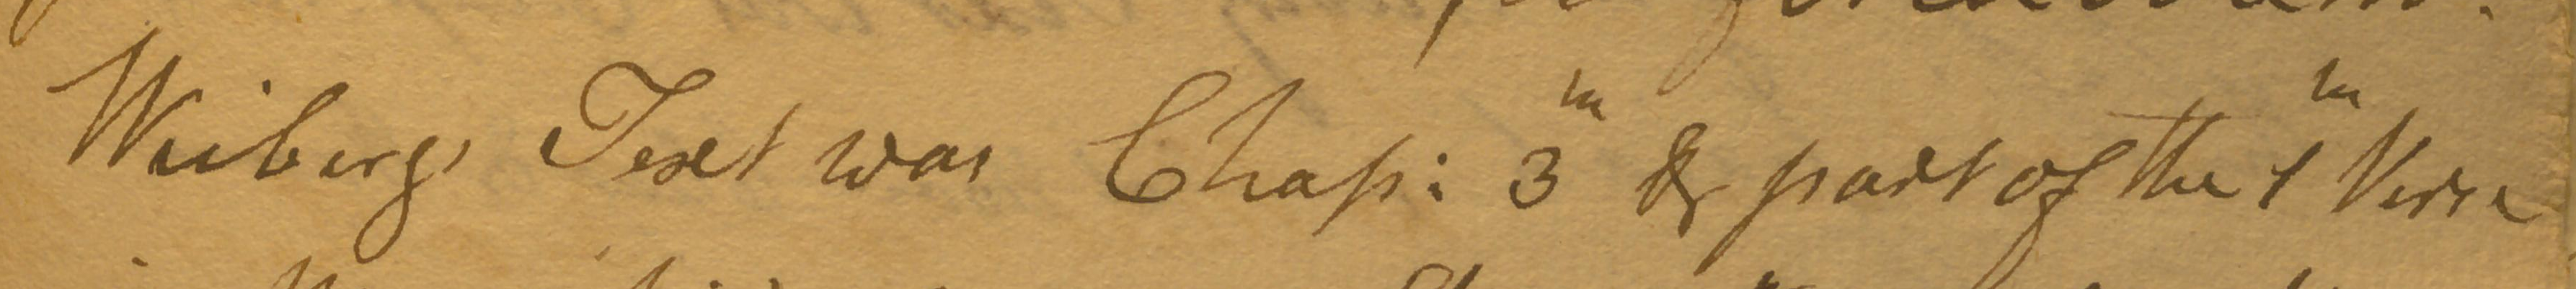Weibergs Text was Chap: 3^th & part of the 1^th Verse
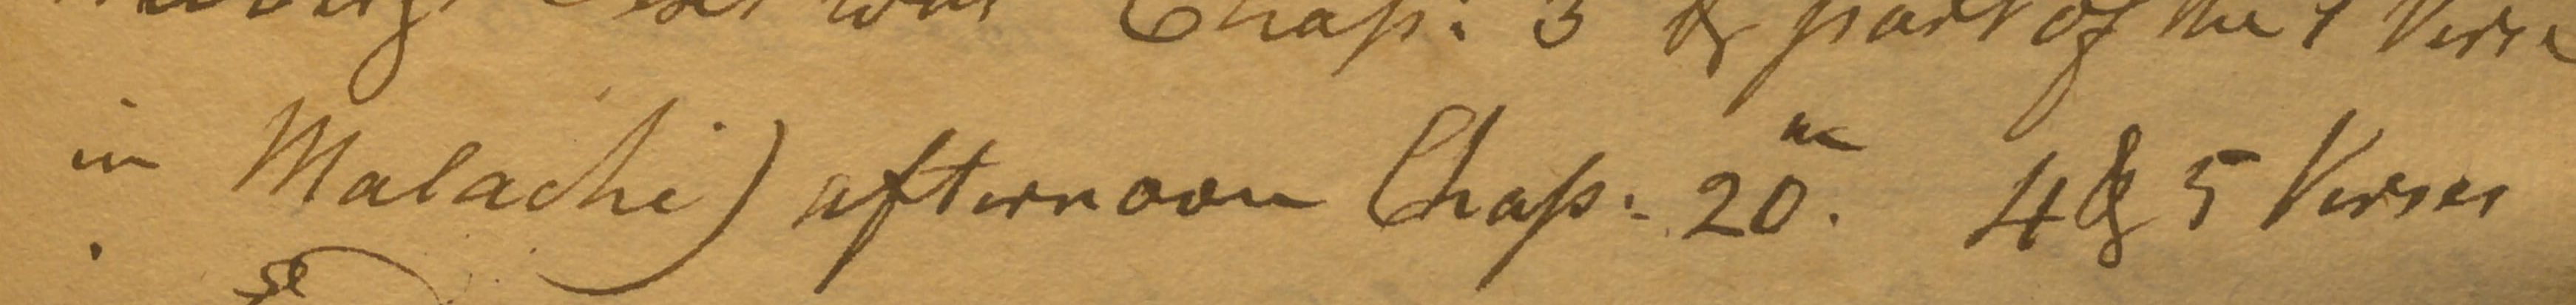in Malachi) afternoon Chap. 20^th. 4 & 5 Verses
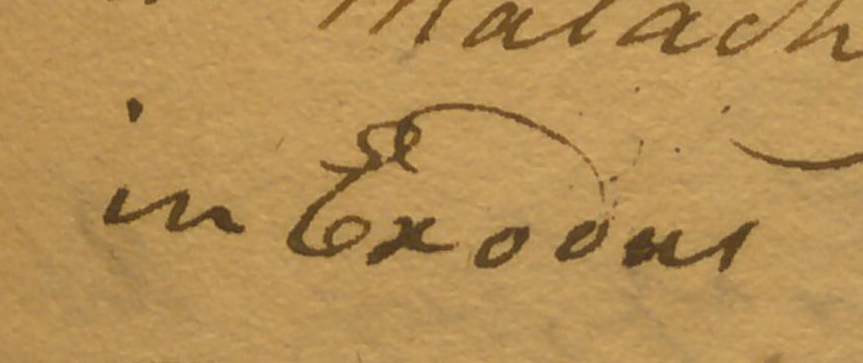in Exodus
